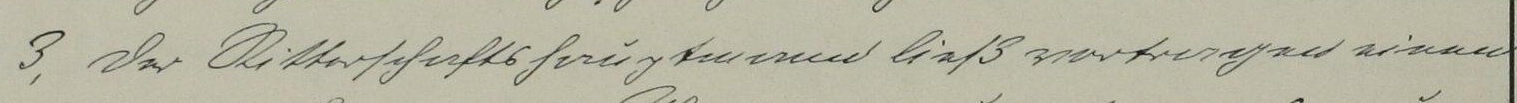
3. Der Ritterschaftshauptmann ließ vortragen einen
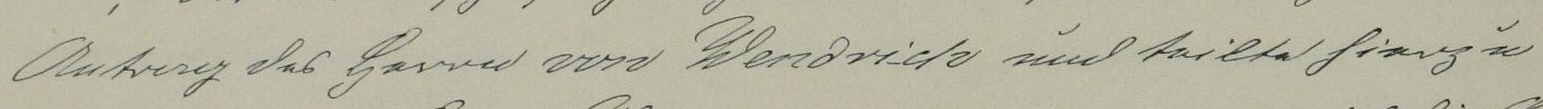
Antrag des Herrn von Wendrich und teilte hierzu
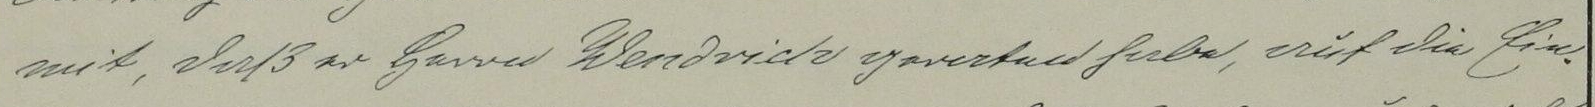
mit, daß er Herrn Wendrich geraten habe, auf die Ein-
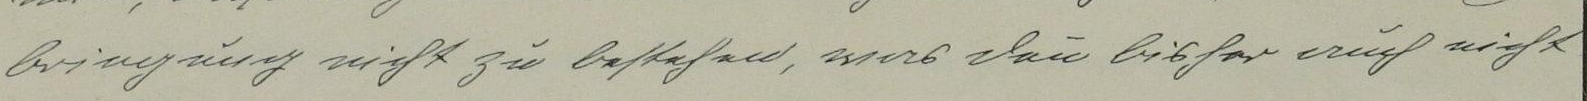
bringung nicht zu bestehen, was denn bisher auch nicht
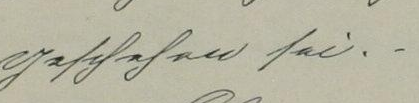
geschehen sei.
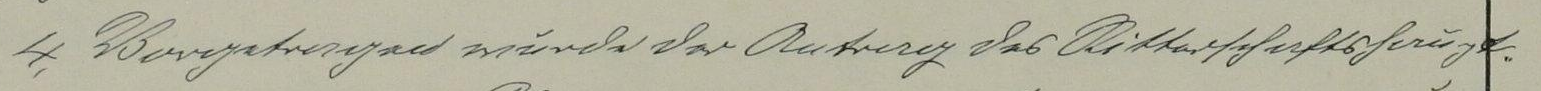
4. Vorgetragen wurde der Antrag des Ritterschaftshaupt-
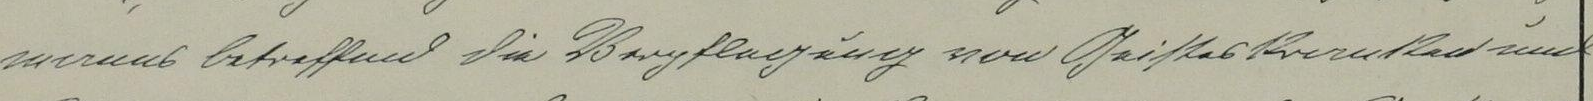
manns betreffend die Verpflegung von Geisteskranken und
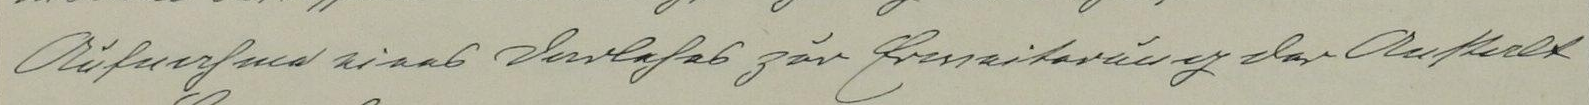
Aufnahme eines Darlehns zur Erweiterung der Anstalt
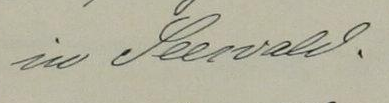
in Seewald.
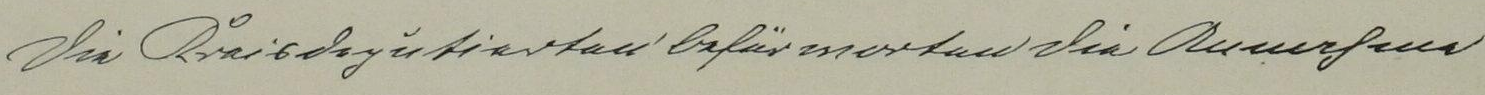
Die Kreisdeputierten befürworten die Annahme
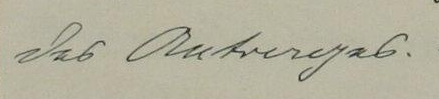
des Antrages.
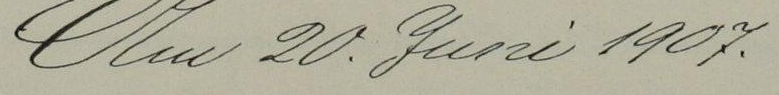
Am 20. Juni 1907.
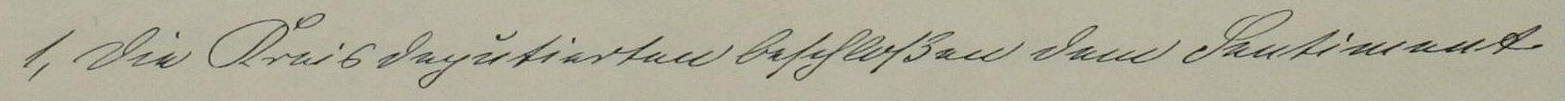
1. Die Kreisdeputierten beschloßen dem Sentiment
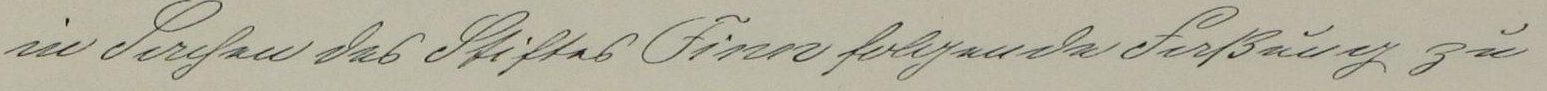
in Sachen des Stiftes Finn folgende Faßung zu
